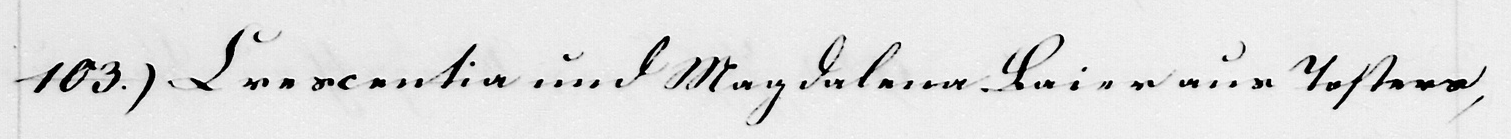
103.) Crescentia und Magdalena Baier aus Tosters,
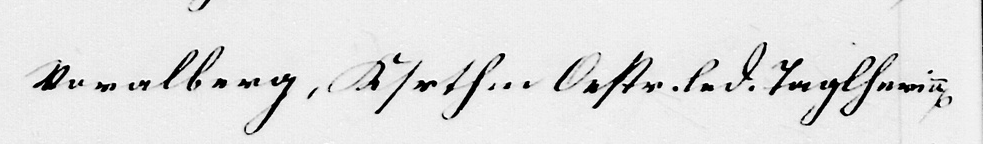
Voralberg, Ksrthm Oestr. led. Taglhnrin¬
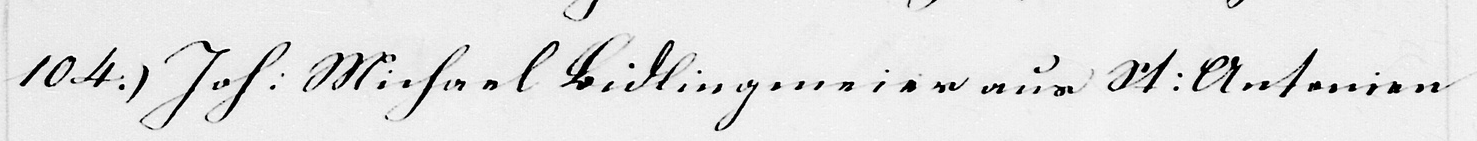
104.) Joh: Michael Bidlingmeier aus St: Antonien
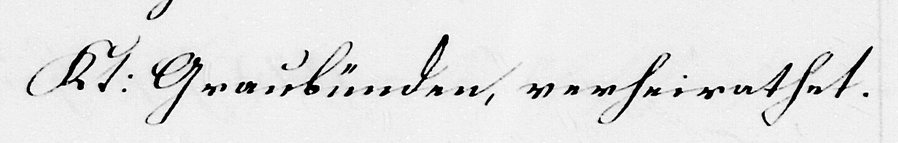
Kt: Graubünden, verheirathet.
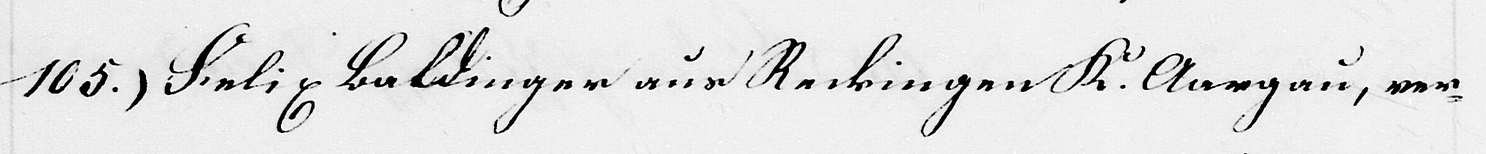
105.) Felix Baldinger aus Reckingen K. Aargau, ver¬
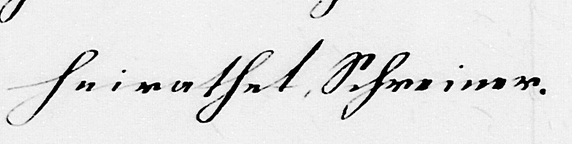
heirathet, Schreiner.
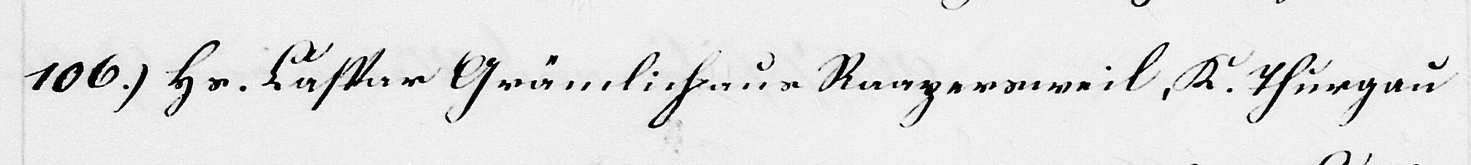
106.) Hs. Caspar Grämlich aus Raapersweil, K. Thurgau
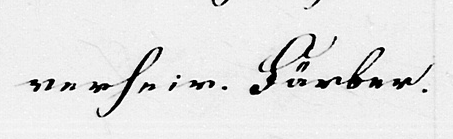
verheir. Färber.
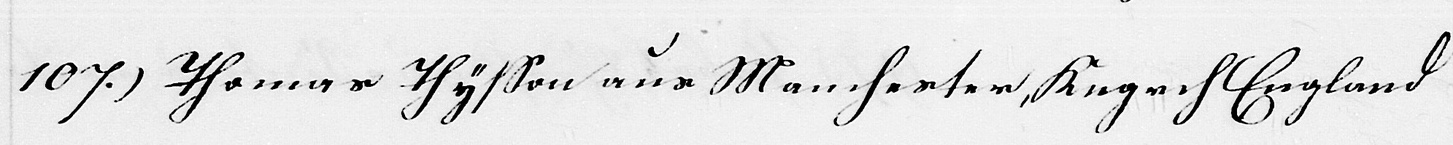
107.) Thomas Thyßon aus Manchester, Kngrch England
